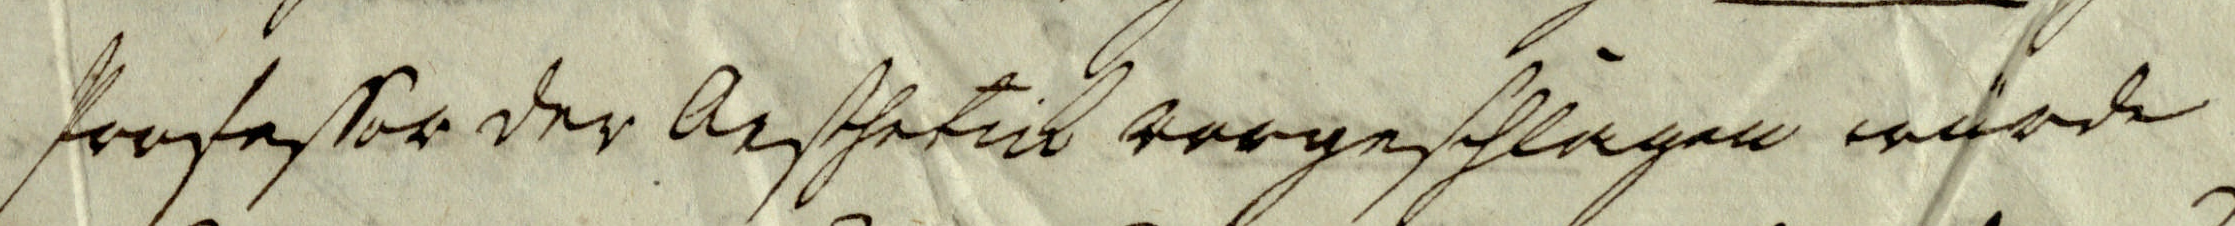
Professor der Aesthetick vorgeschlagen würde
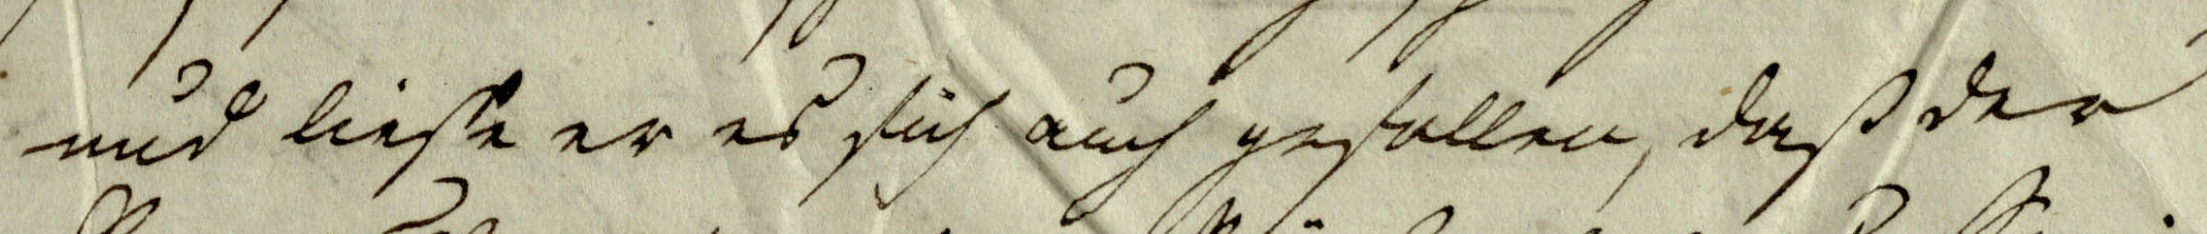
und liesse er es sich auch gefallen, daß der
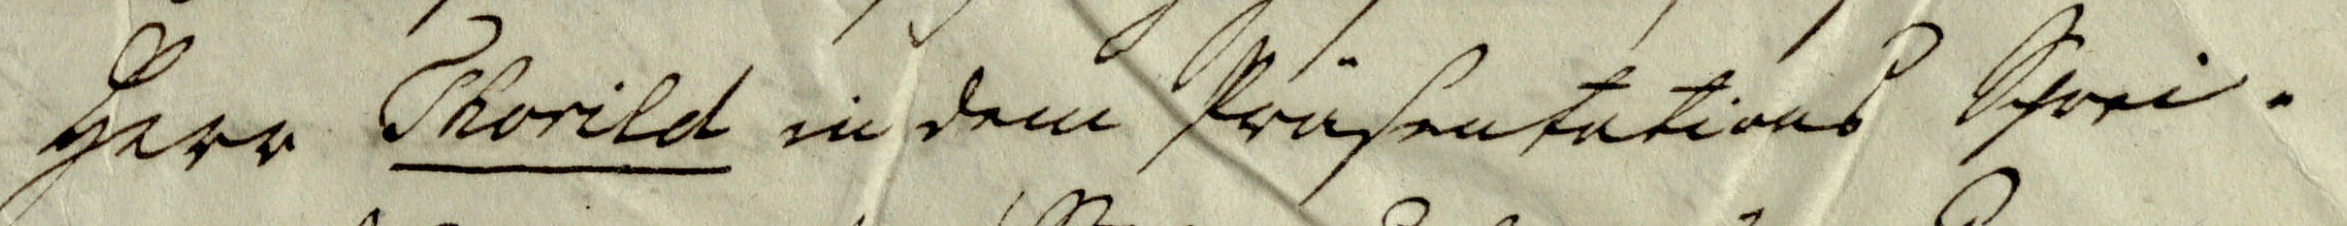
Herr Thorild in dem Präsentations Schrei¬
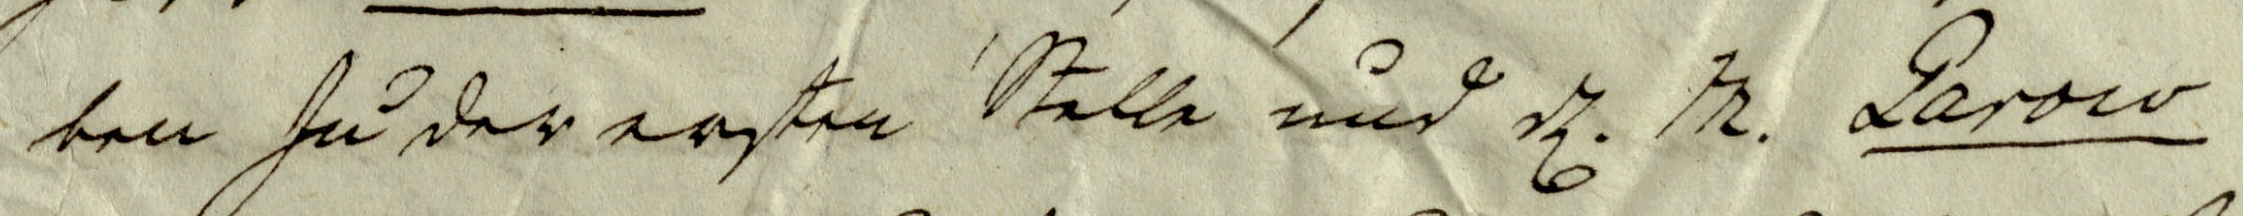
ben zu der ersten Stelle und dh. M. Larow
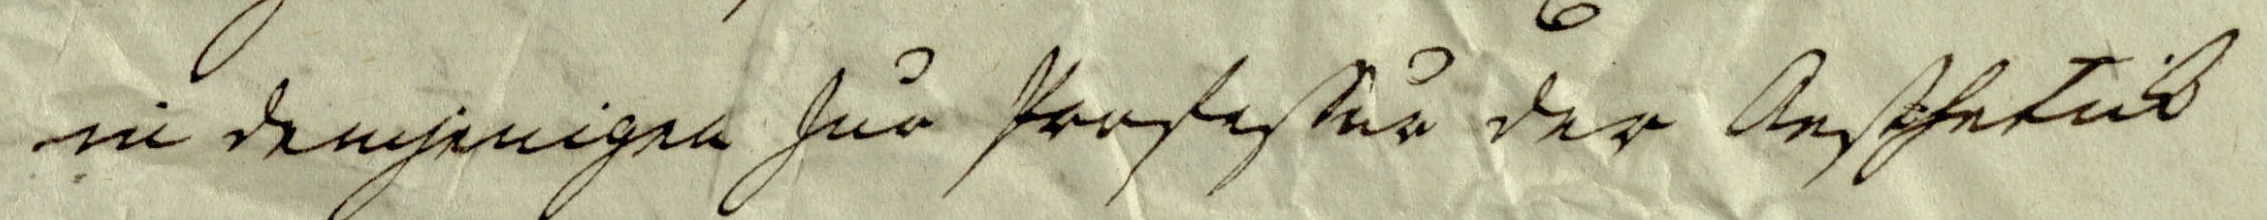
in demjenigen zur Professur der Aesthetick
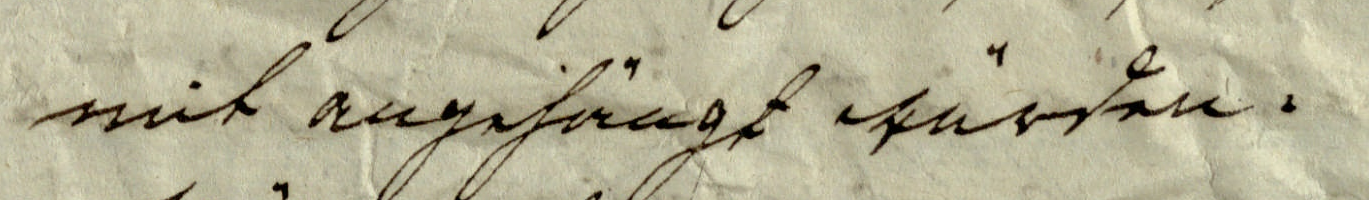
mit angehängt würden.
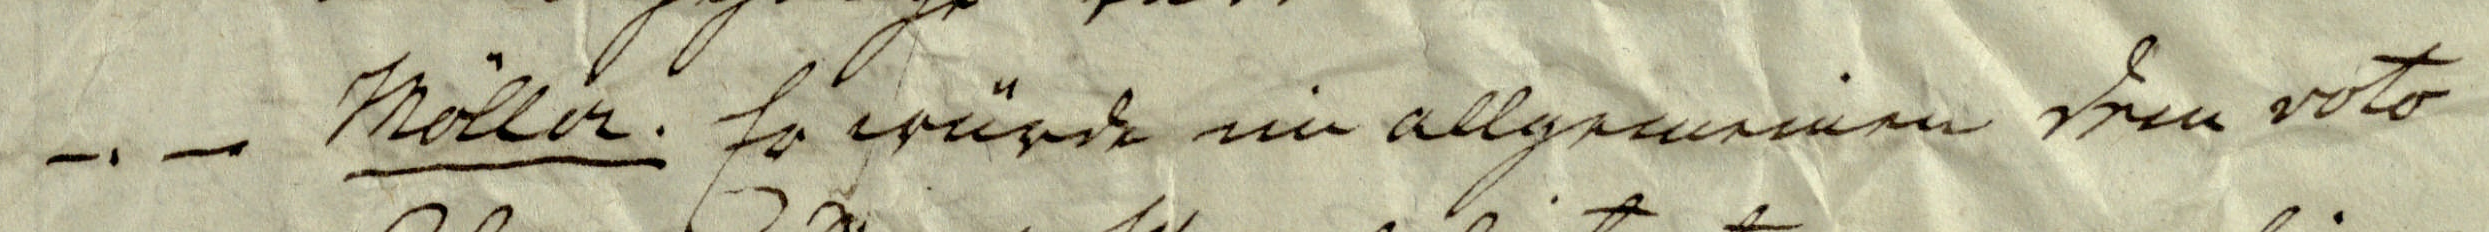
— " — Möller. Er würde im allgemeinen dem voto
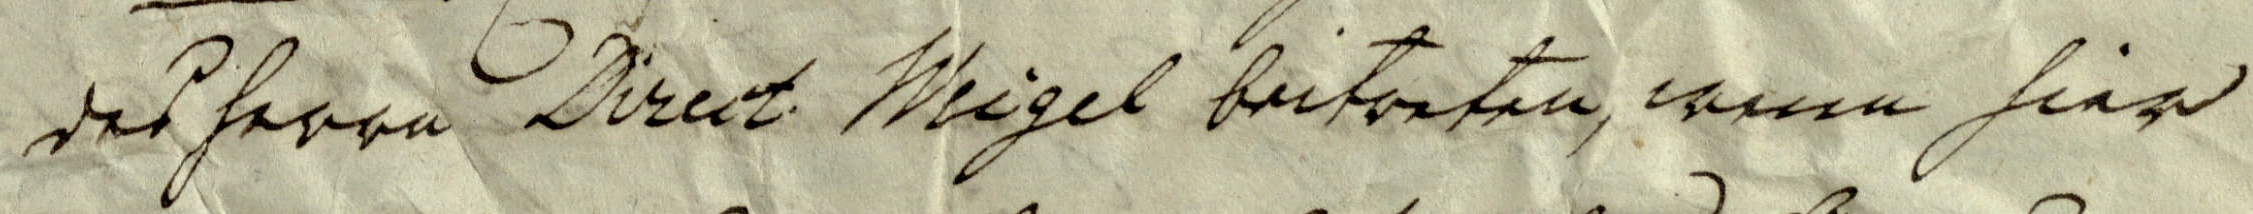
des Herrn Direct. Weigel beitreten, wenn hier
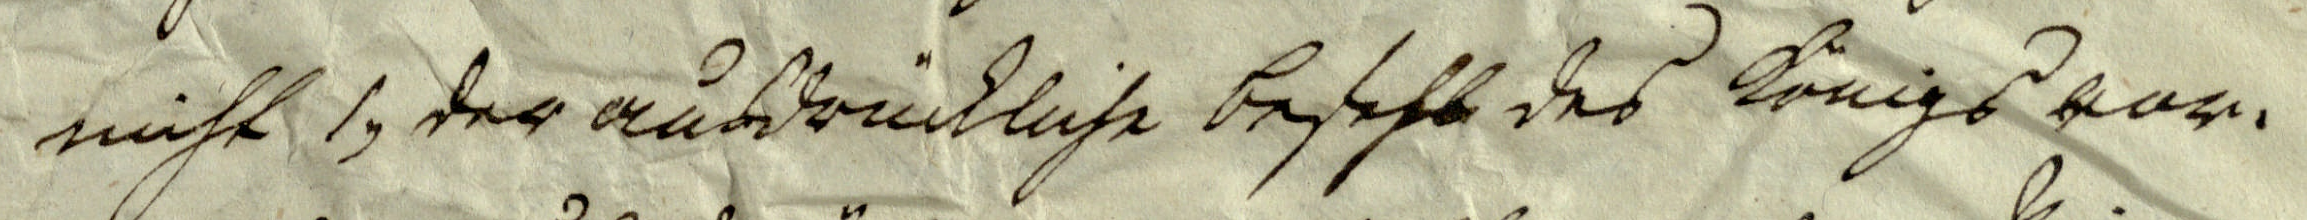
nicht 1., der ausdrückliche Befehl des Königs vor¬
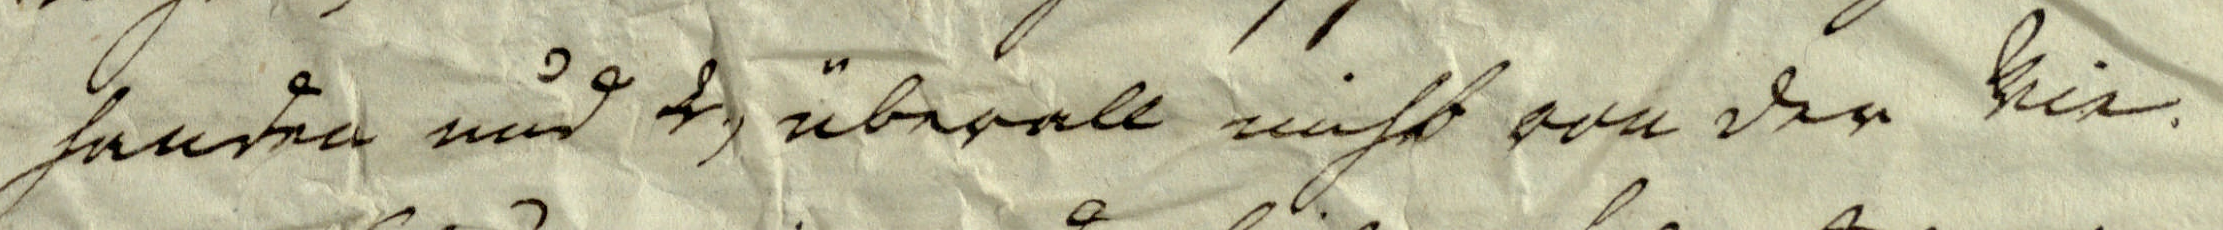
handen und 2., überall nicht von der Wie¬
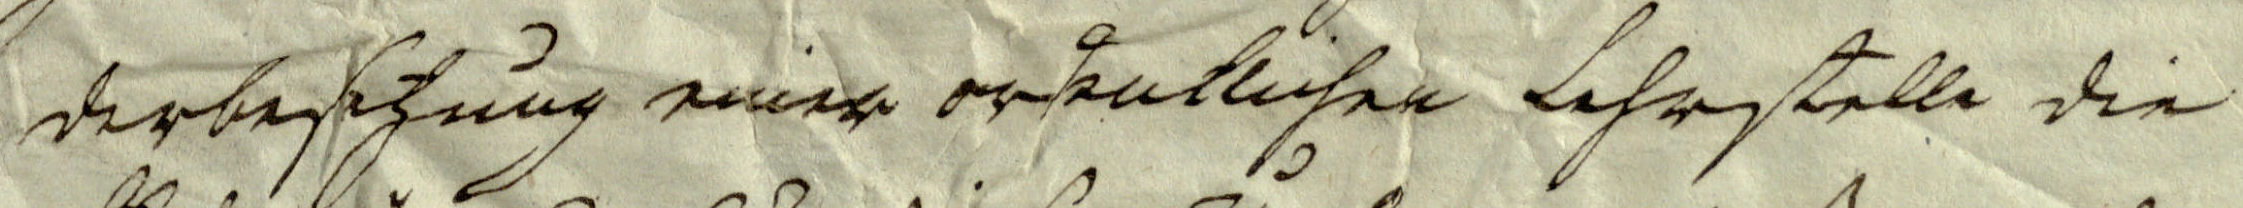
derbesetzung einer ordentlichen Lehrstelle die
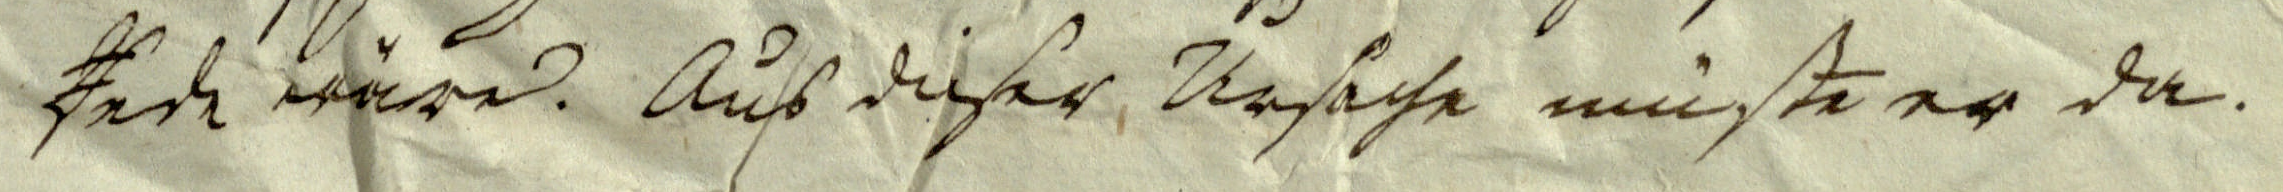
Rede wäre. Aus dieser Ursache müsste er da¬
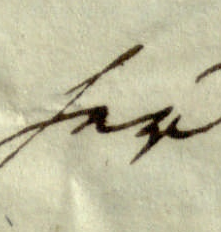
her
